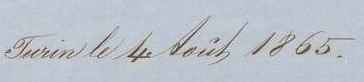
Turin le 4 Août 1865.
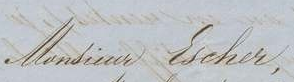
Monsieur Escher,
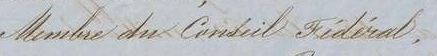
Membre du Conseil Fédéral,
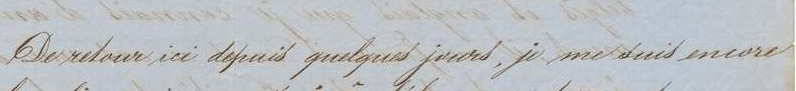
De retour ici depuis quelques jours, je me suis encore
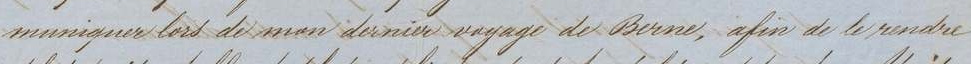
muniquer lors de mon dernier voyage de Berne, afin de le rendre
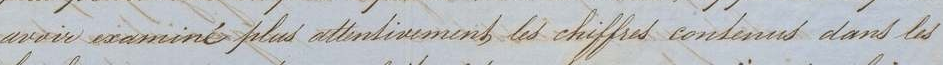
avoir examiné plus attentivement les chiffres contenus dans les
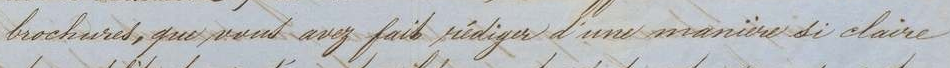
brochures, que vous avez fait rédiger d'une manière si claire
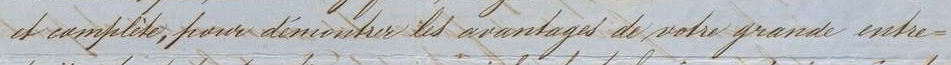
et complète, pour démontrer les avantages de votre grande entre-
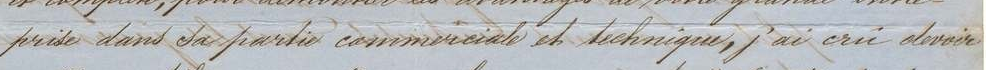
prise dans sa partie commerciale et technique, j'ai crû devoir
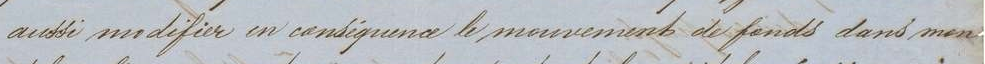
aussi modifier en conséquence le mouvement de fonds dans mon
